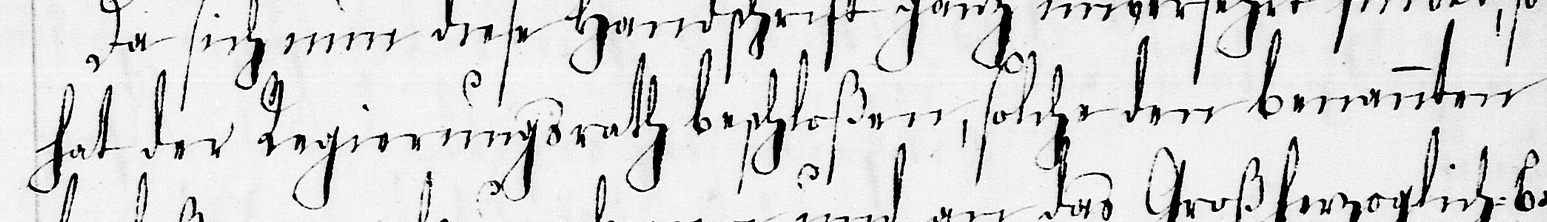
hat der Regierungsrath beschloßen, solche den benannten
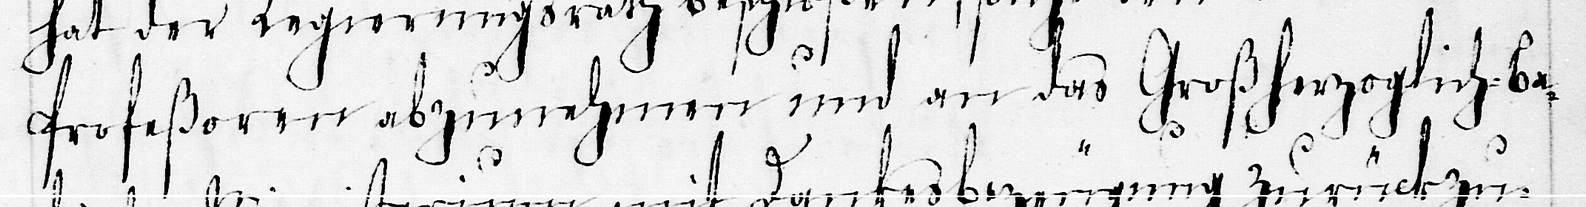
Profeßoren abzunehmen und an das Großherzoglich-Ba¬
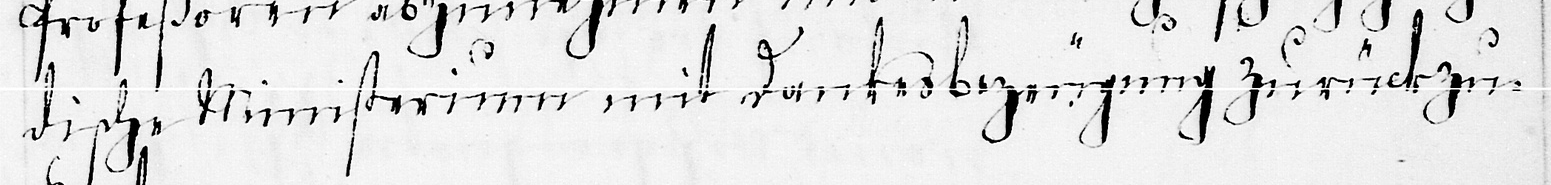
dische Ministerium mit Dankesbezeugung zurückzu¬
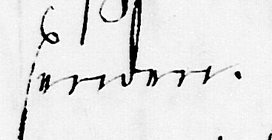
senden.
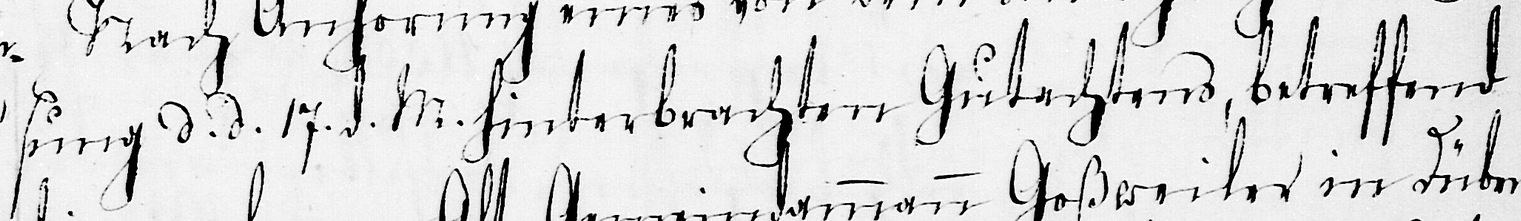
sung d. d. 17. d. M. hinterbrachten Gutachtens, betreffend
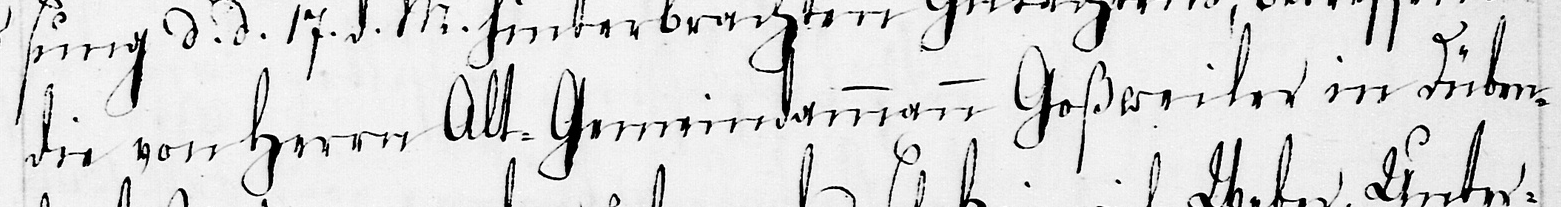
die von Herrn Alt-Gemeindammann Goßweiler in Düben¬
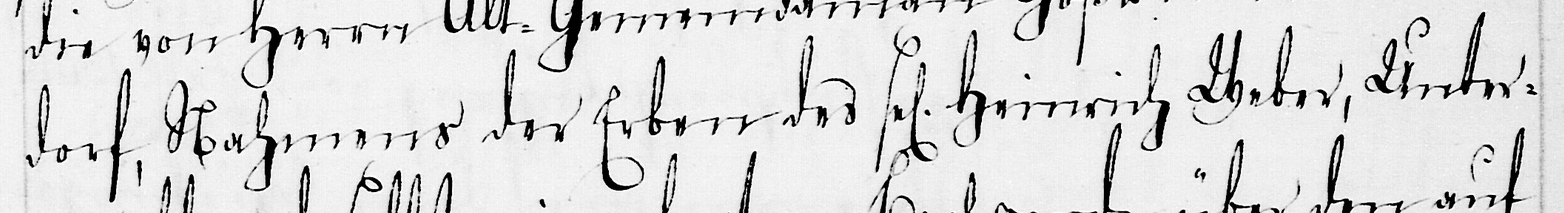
dorf, Nahmens der Erben des sel. Heinrich Weber, Unter¬
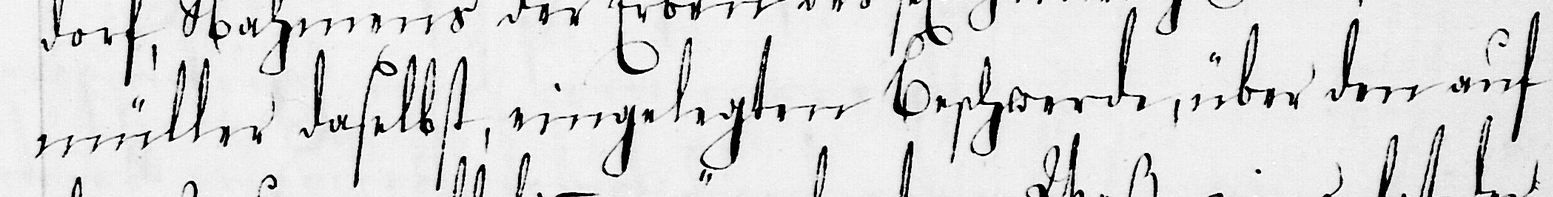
müller daselbst, eingelegten Beschwerde, über den auf
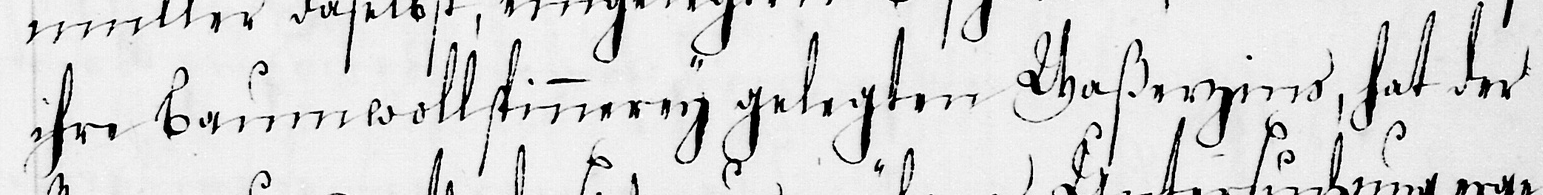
ihre Baumwollspinnerey gelegten Waßerzins, hat der
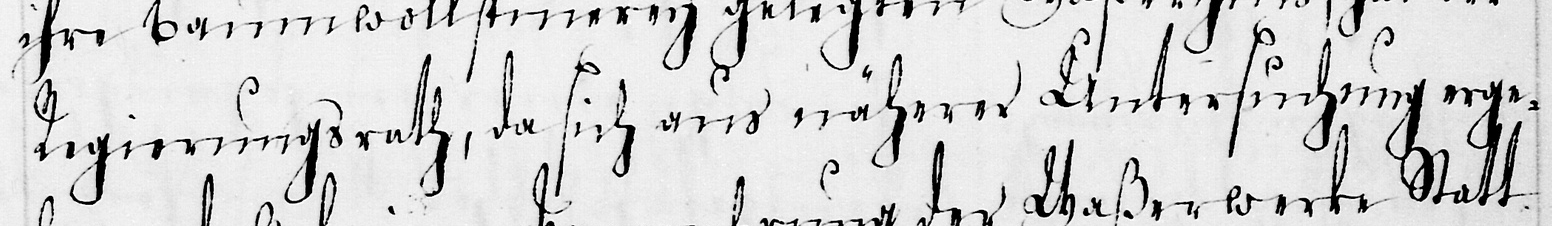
Regierungsrath, da sich aus näherer Untersuchung erge¬
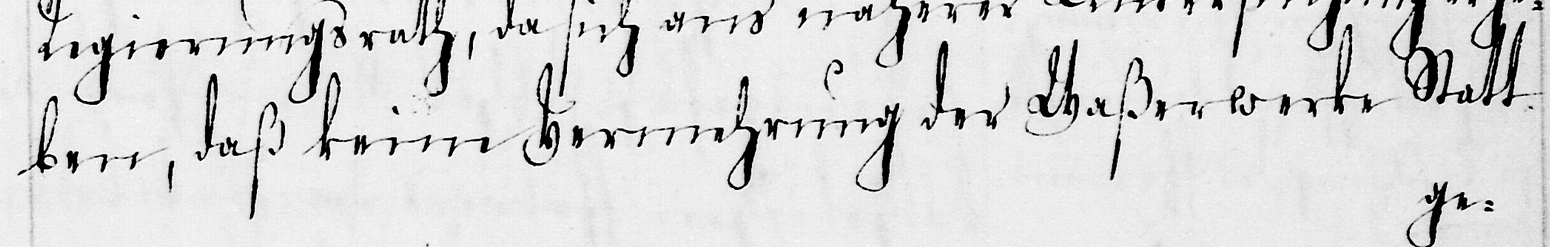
ben, daß keine Vermehrung der Waßerwerke Statt
